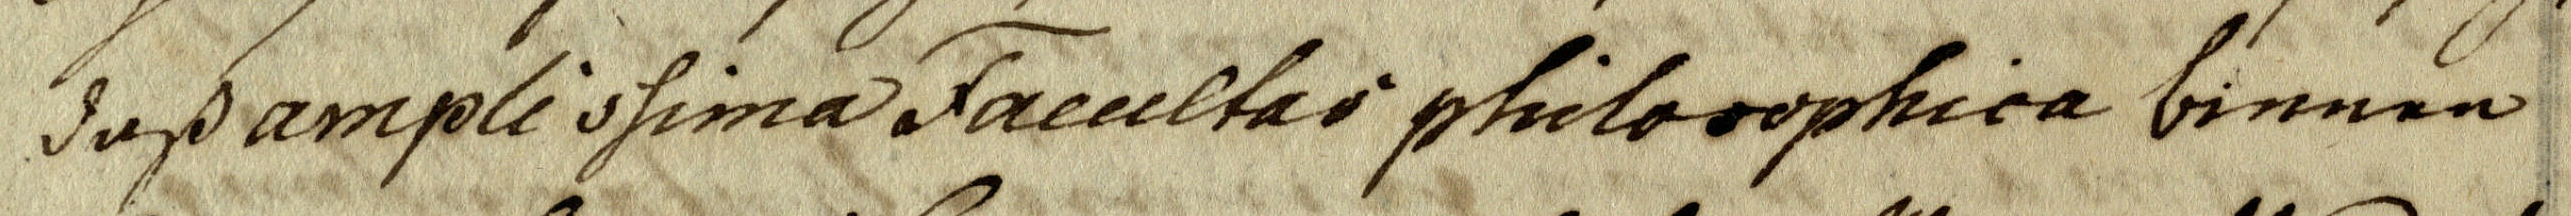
daß amplissima Facultas philosophica binnen
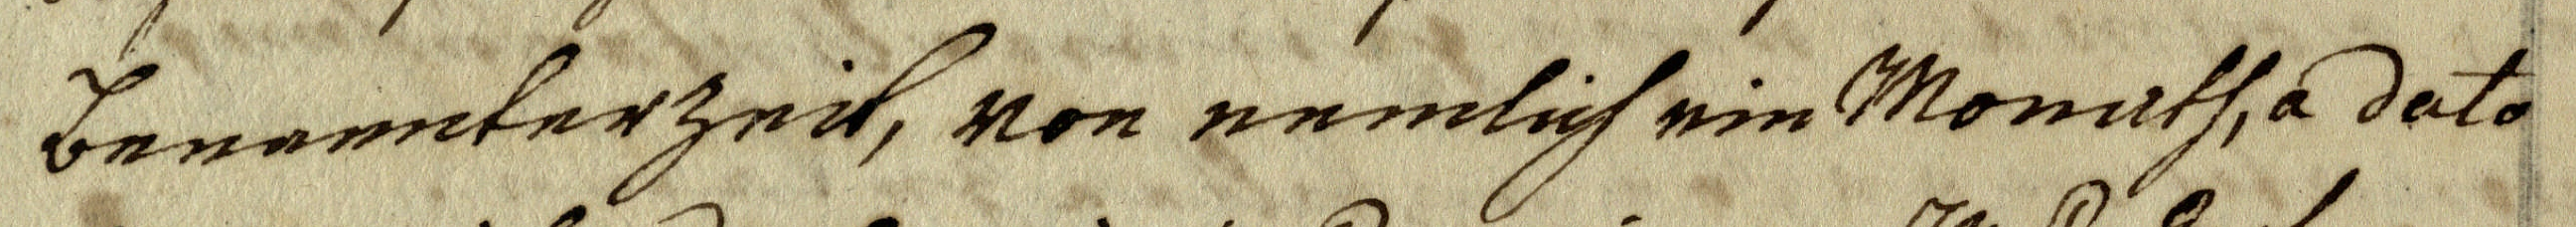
benannter Zeit, von nemlich ein Monath, a dato
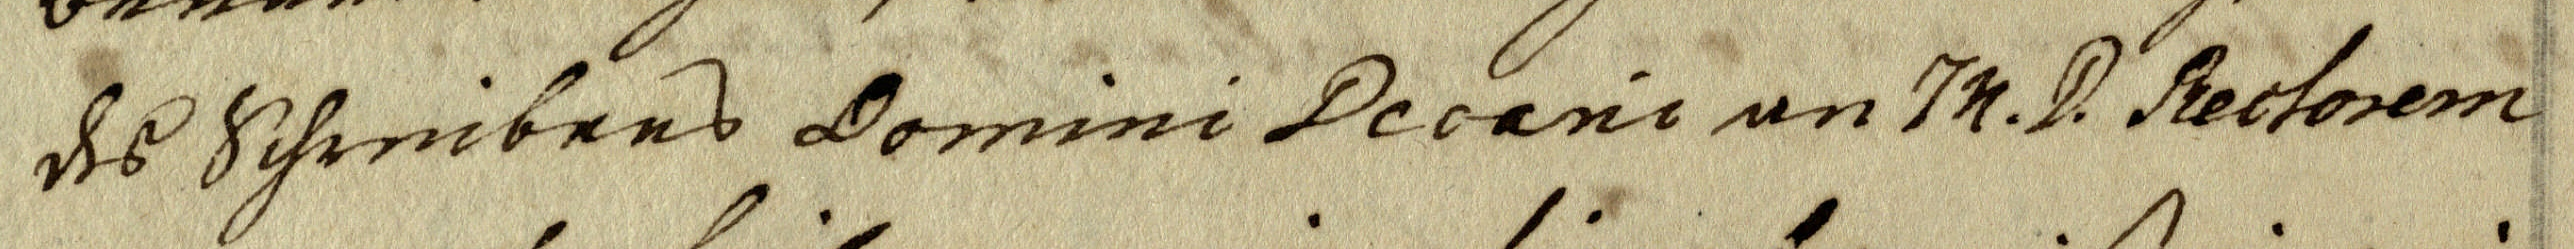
des Schreibens Domini Decani an M. D. Rectorem
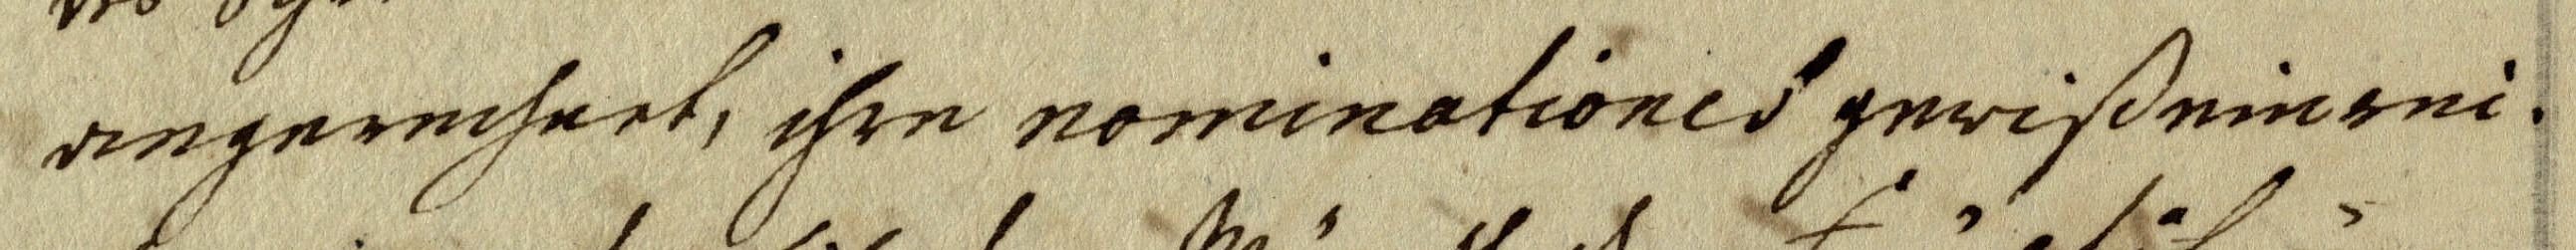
angerechnet, ihre nominationes gewiß einrei¬
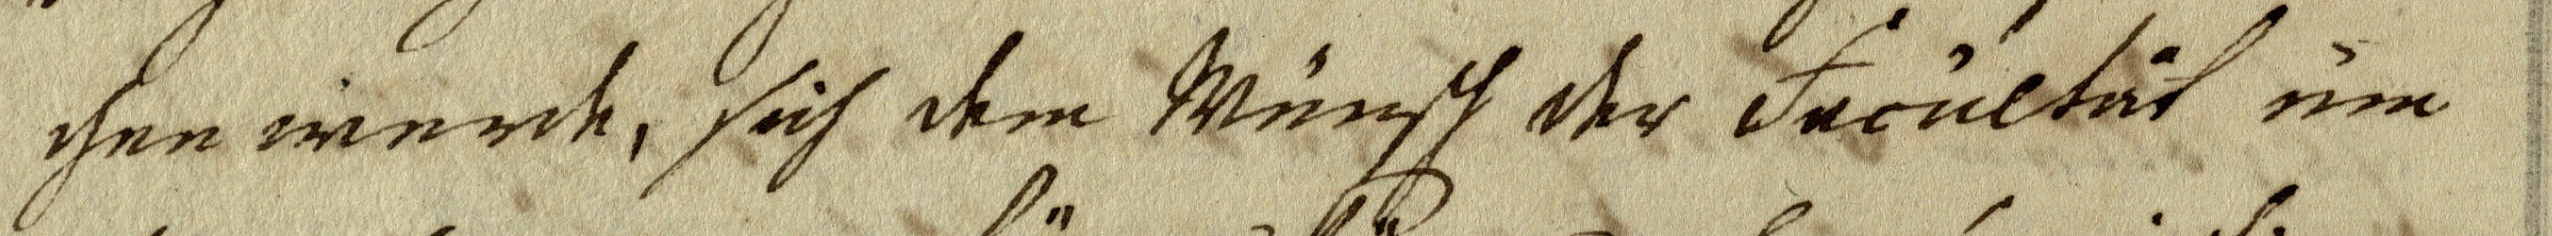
chen werde, sich dem Wunsch der Facultät um
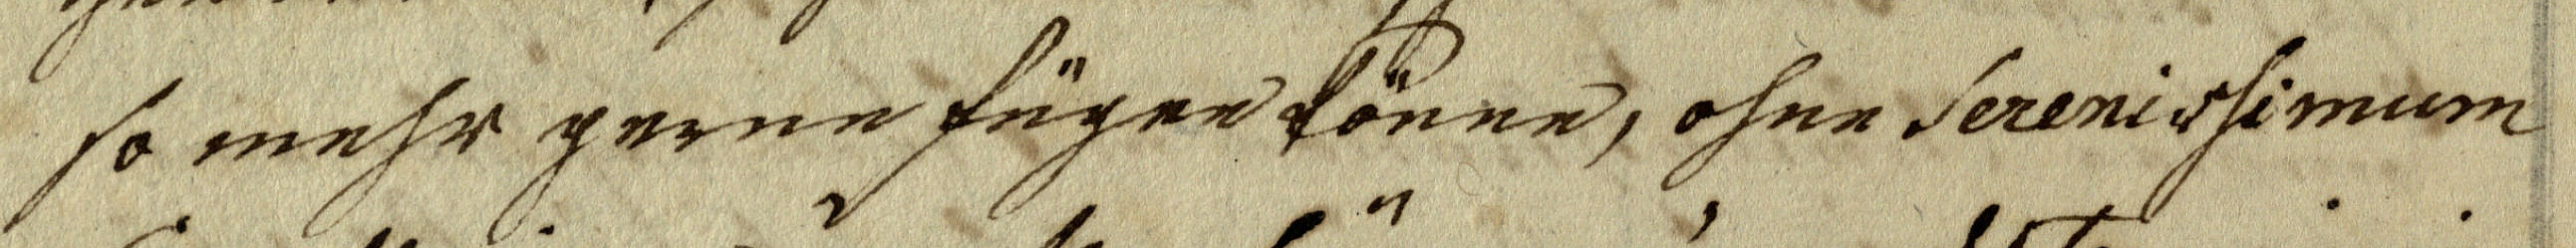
so mehr gerne fügen könne, ohne Seremissimum
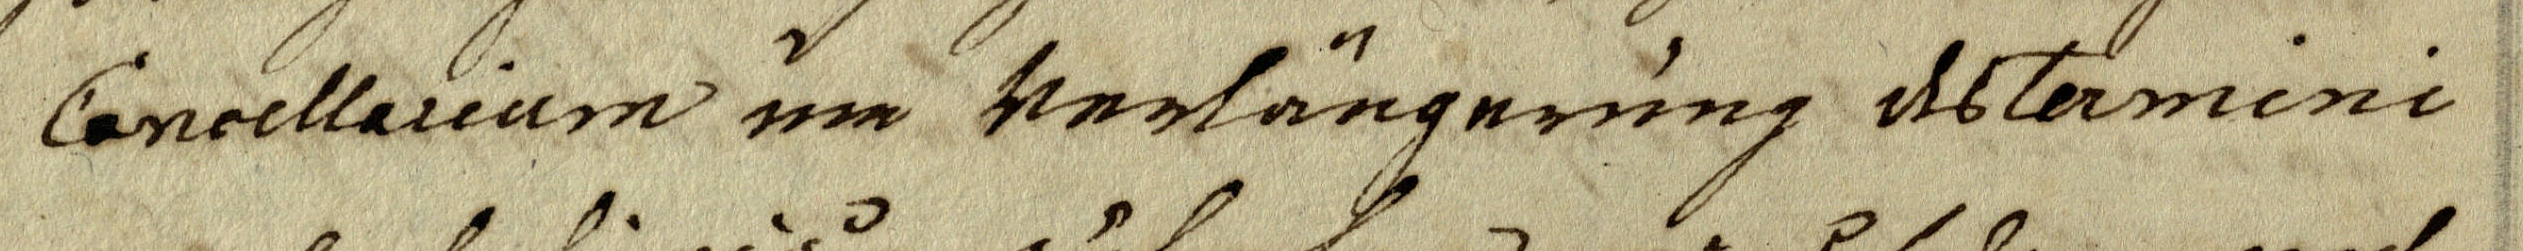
Cancellarium um Verlängerung des termini
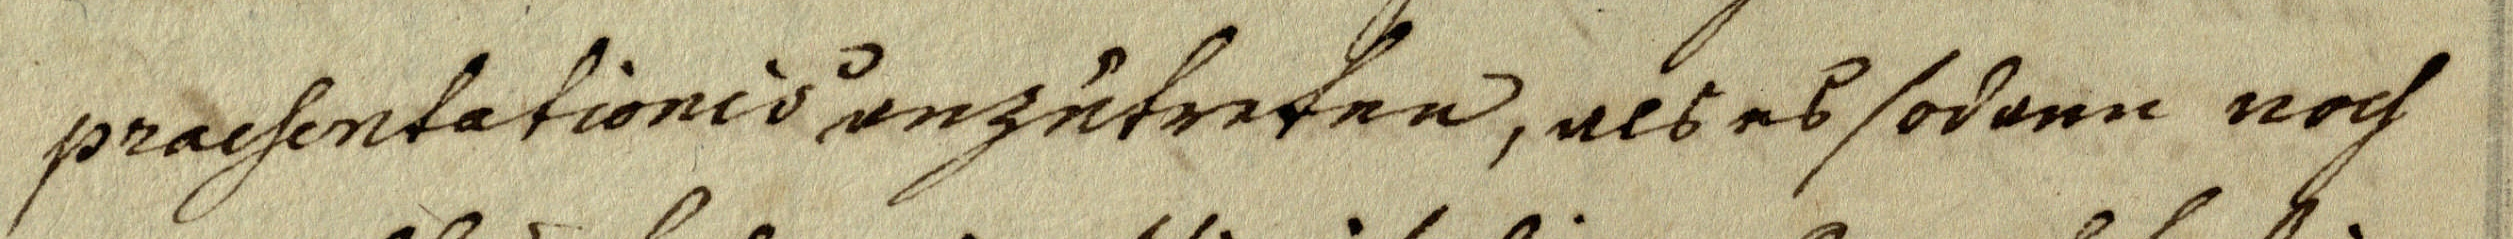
praesentationis anzutreten, als es sodann noch
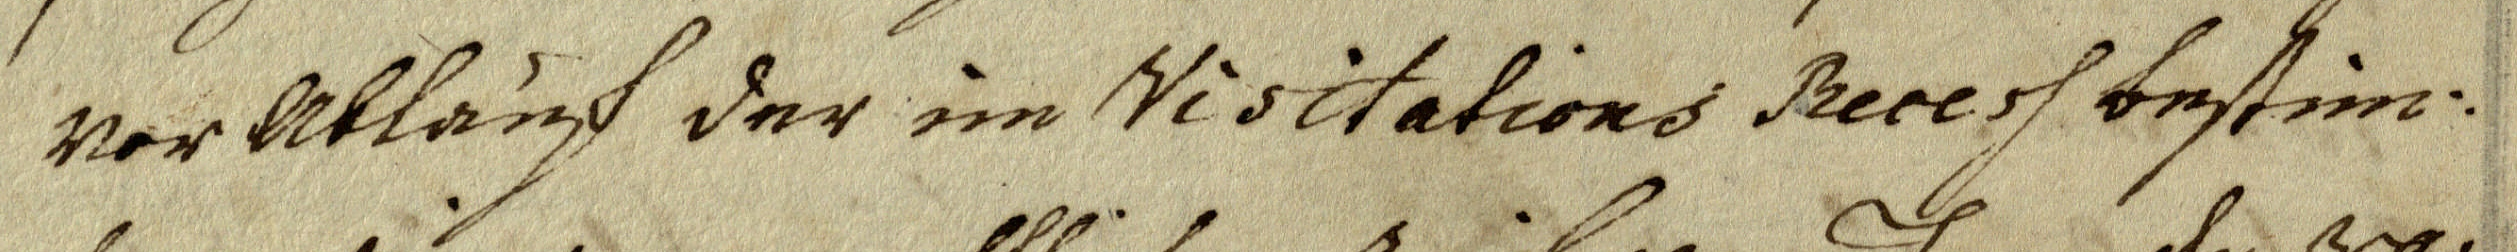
vor Ablauf der im Visitations Recess bestim¬
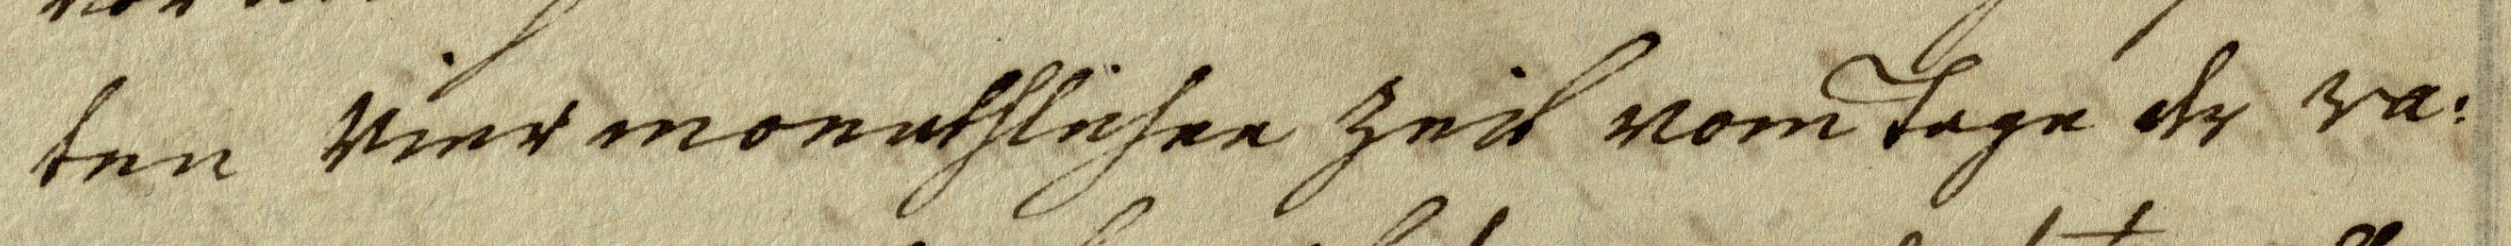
ten viermonathlichen Zeit vom Tage der va¬
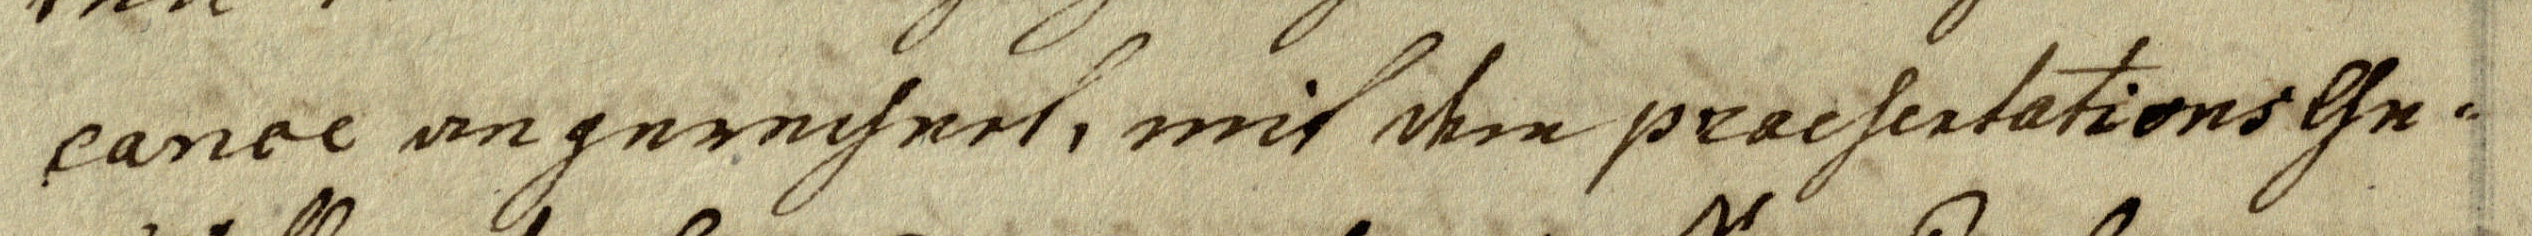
cance angerechnet, mit dem praesentations Ge¬
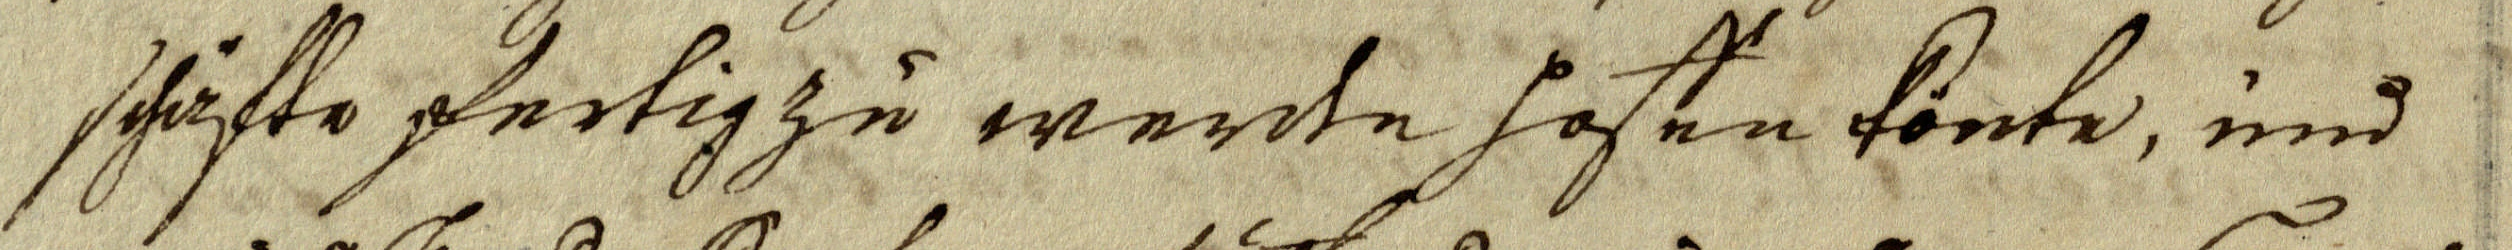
schäfte fertig zu werden hoffen könte, und
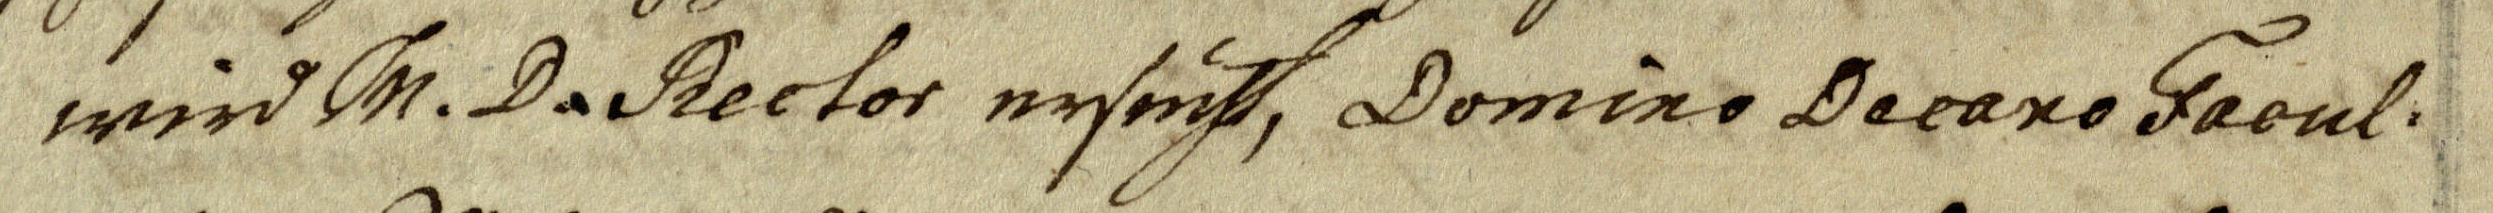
wird M. D. Rector ersucht, Domino Decano Facul¬
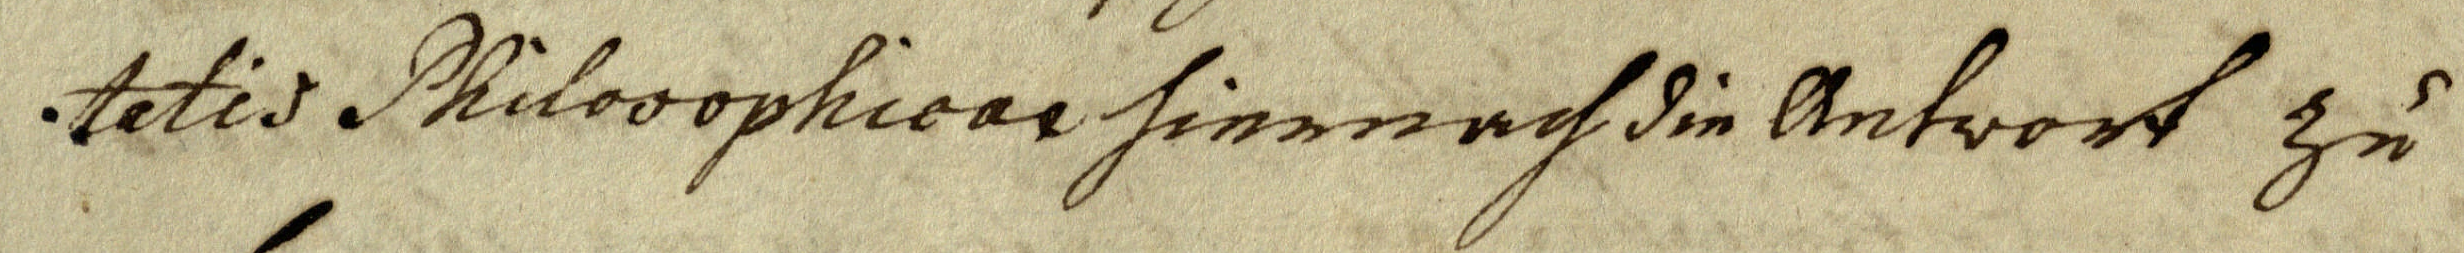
tatis Philosophicae hiernach die Antwort zu
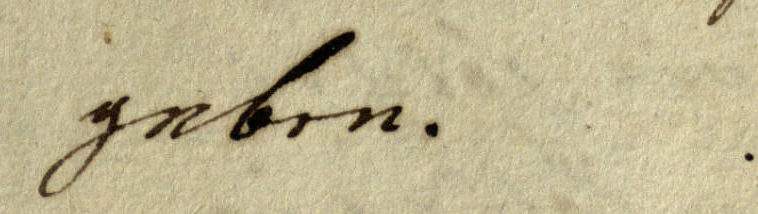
geben.
